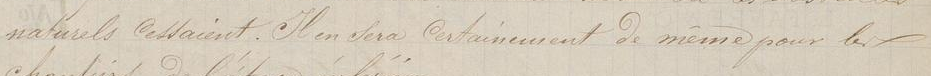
naturels cessaient. Il en sera certainement de même pour les
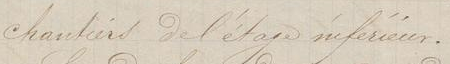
chantiers de l'étage inférieur.
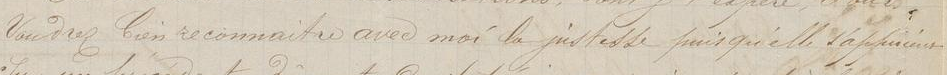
voudrez bien reconnaitre avec moi la justesse puisqu'elles s'appuient
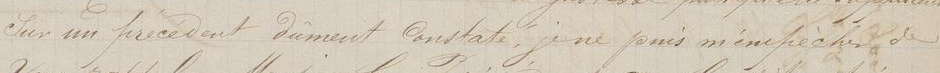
sur un précédent dûment constaté, je ne puis m'empècher de
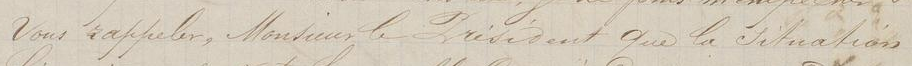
vous rappeler, Monsieur le Président que la situation
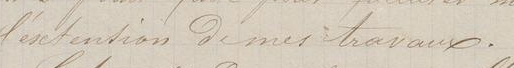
l'extention de mes travaux.
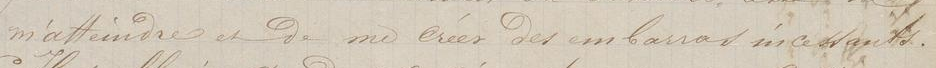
m'atteindre et de me créer des embarras incessants.
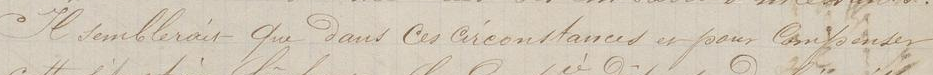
Il semblerait que dans ces circonstances et pour compenser
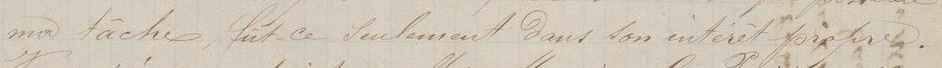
ma tâche, fût–ce seulement dans son intérêt propre.
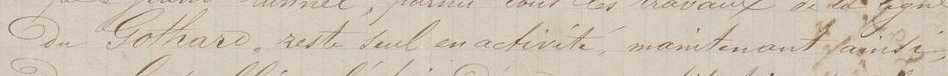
du Gothard, reste seul en activité, maintenant ainsi,
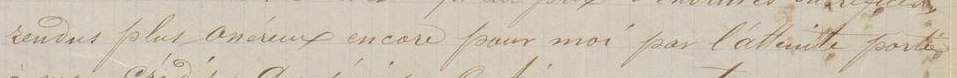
rendus plus onéreux encore pour moi par l'atteinte portée
